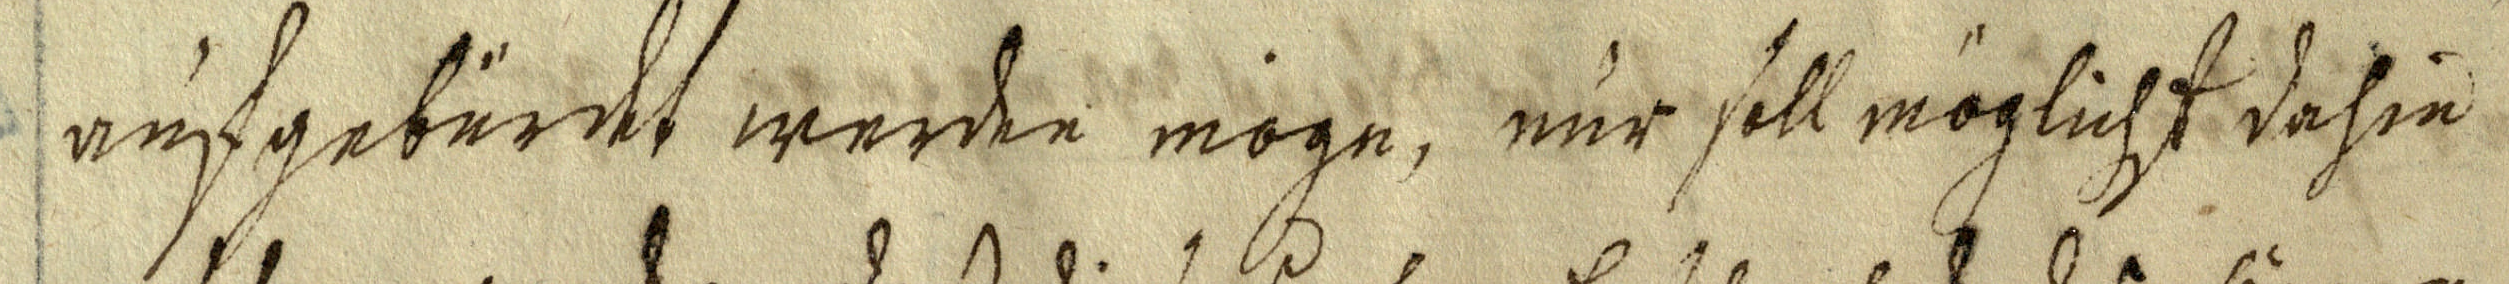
aufgebürdet werden möge, nur soll möglichst dahin
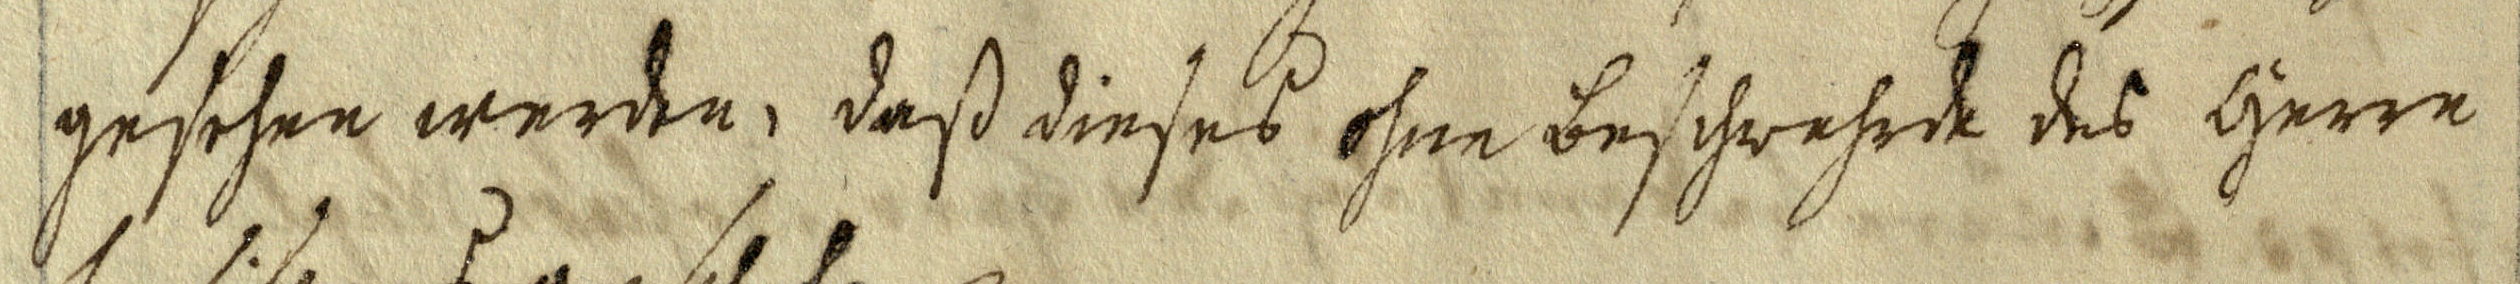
gesehen werden, daß dieses ohne Beschwehrde des Herrn
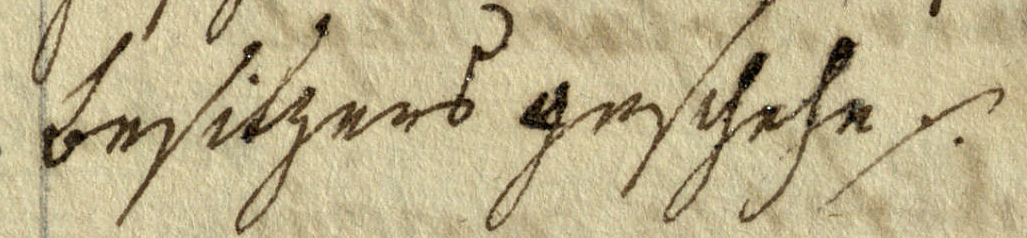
Besitzers geschehe.
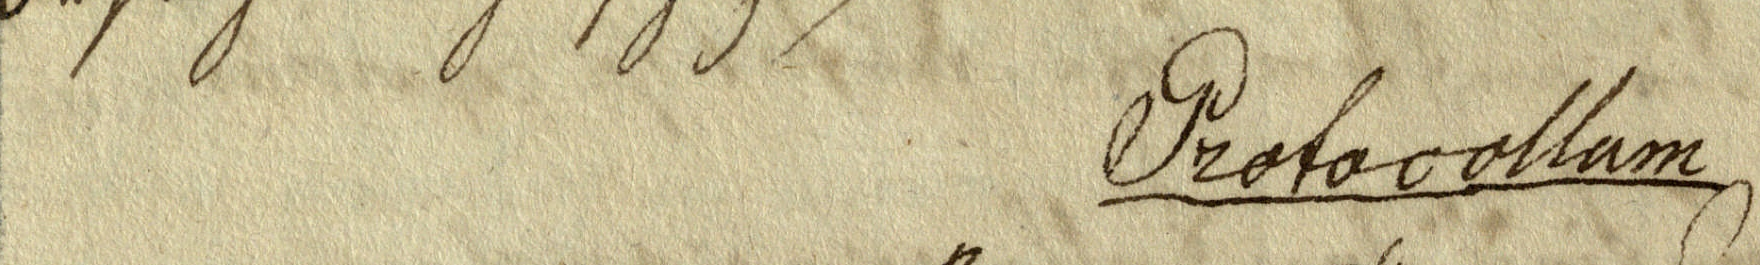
Protocollum
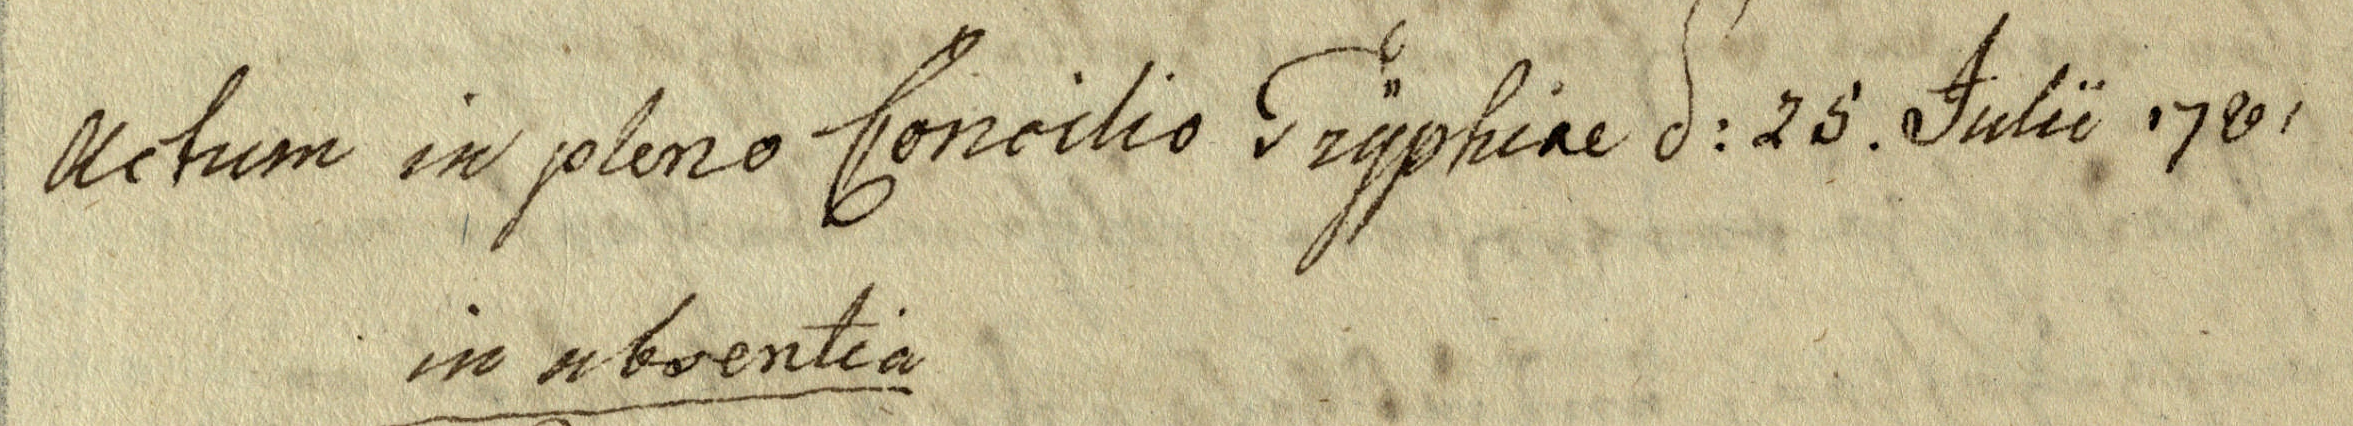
Actum in pleno Concilio Grÿphiae d: 25. Julii 1781
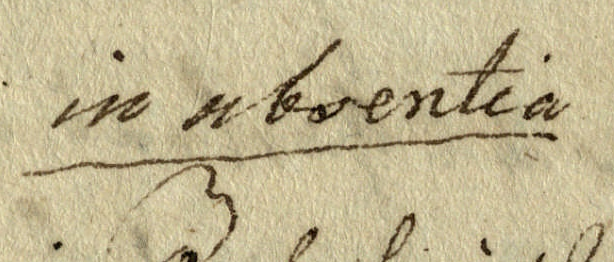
in absentia
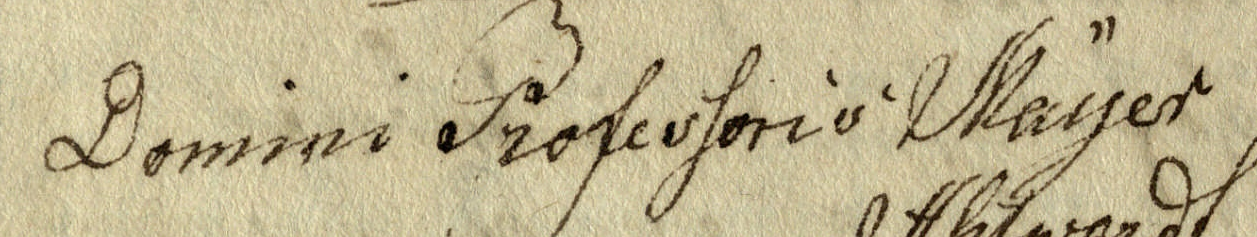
Domini Professoris Maÿer
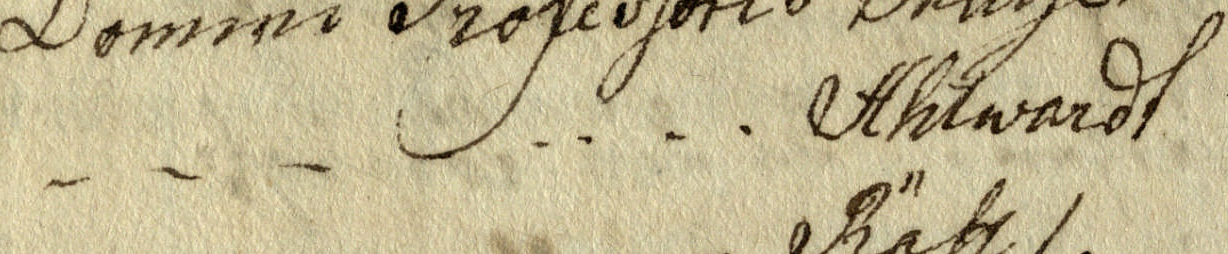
Ahlwardt
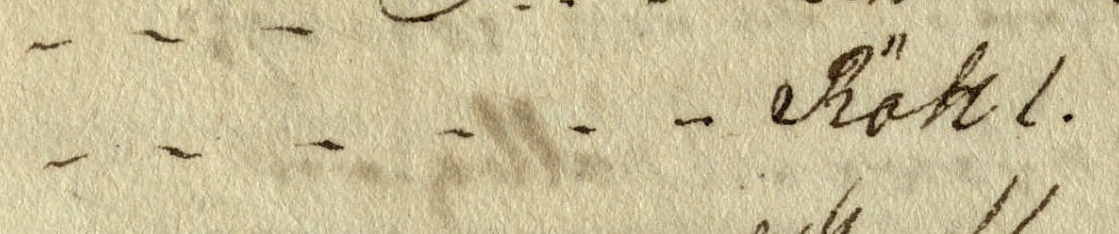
Röhl
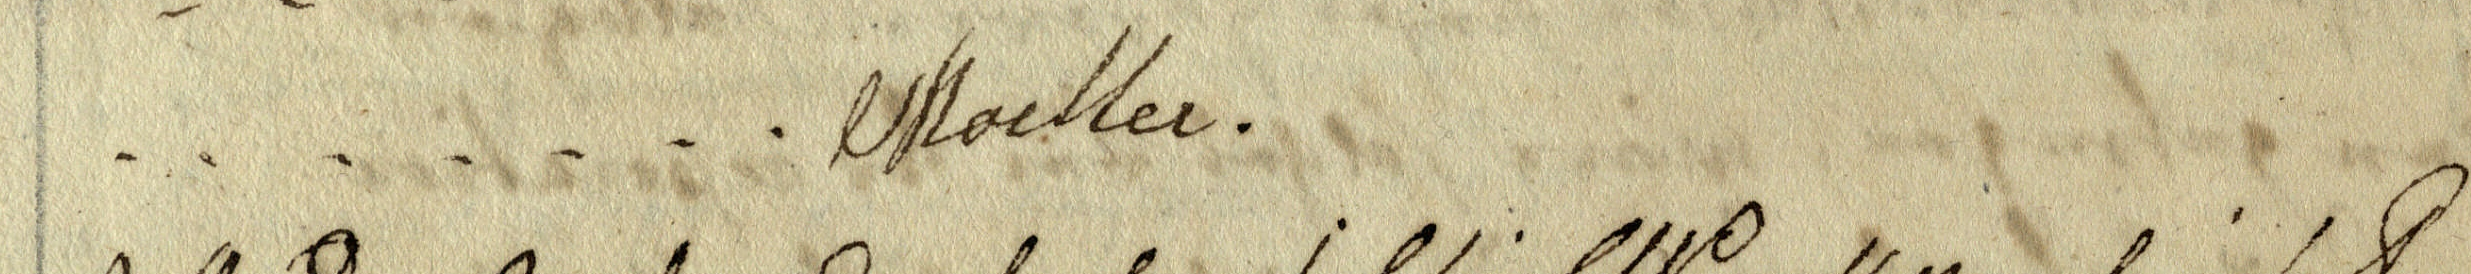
Moeller
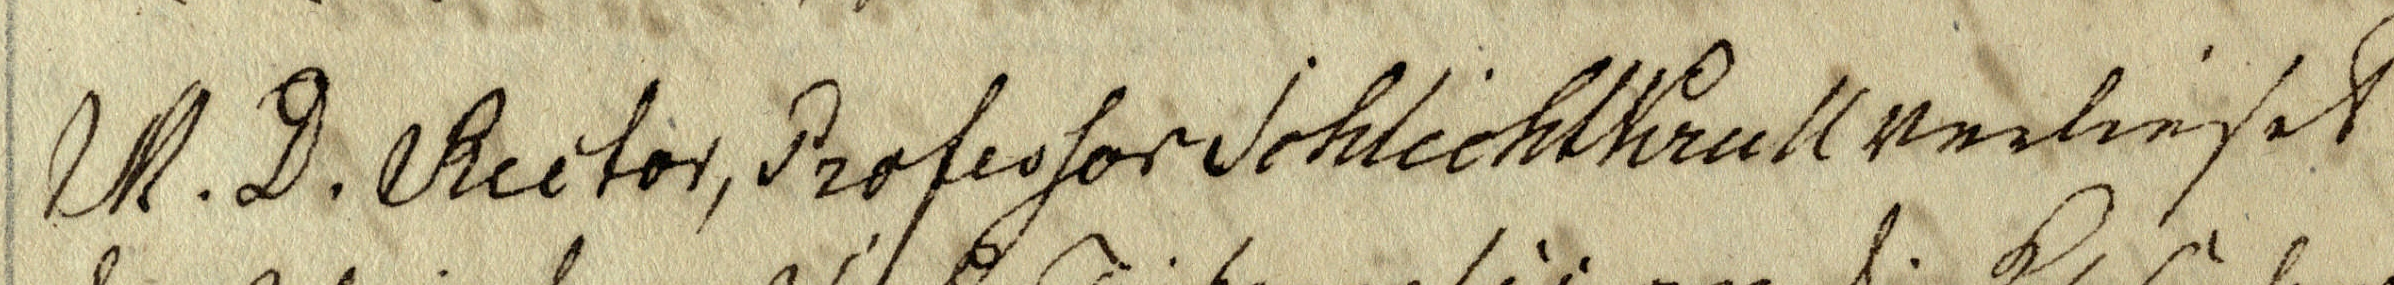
M. D. Rector, Professor Schlichtkrull verlieset
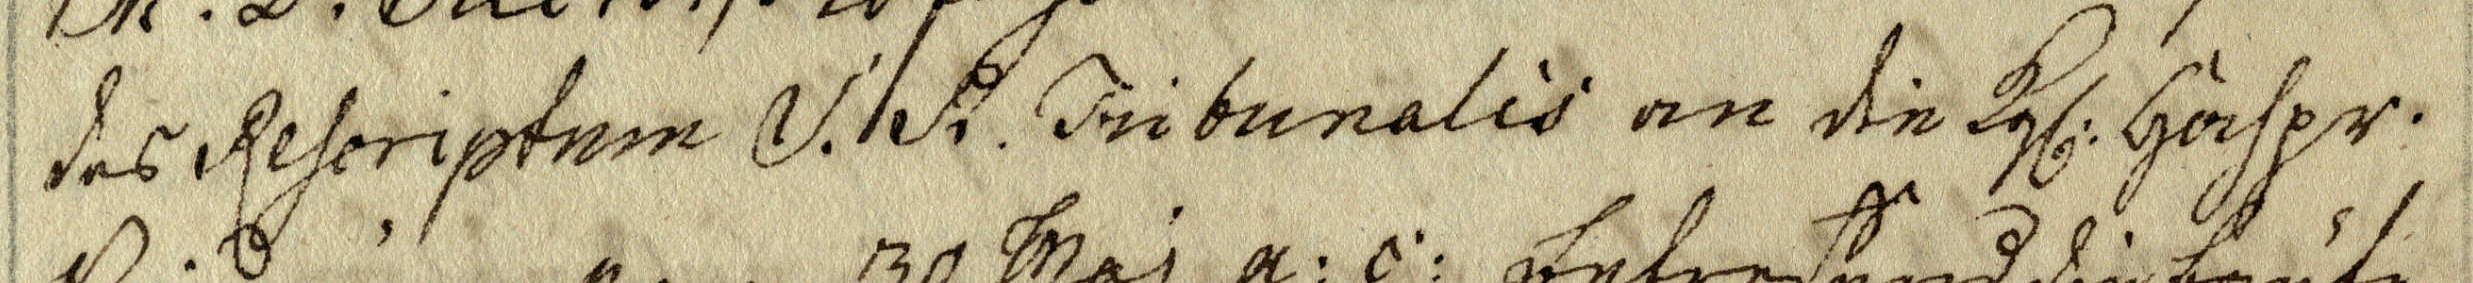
das Rescriptum, S.S. Tribunalis an die Kgl: Hochpr.
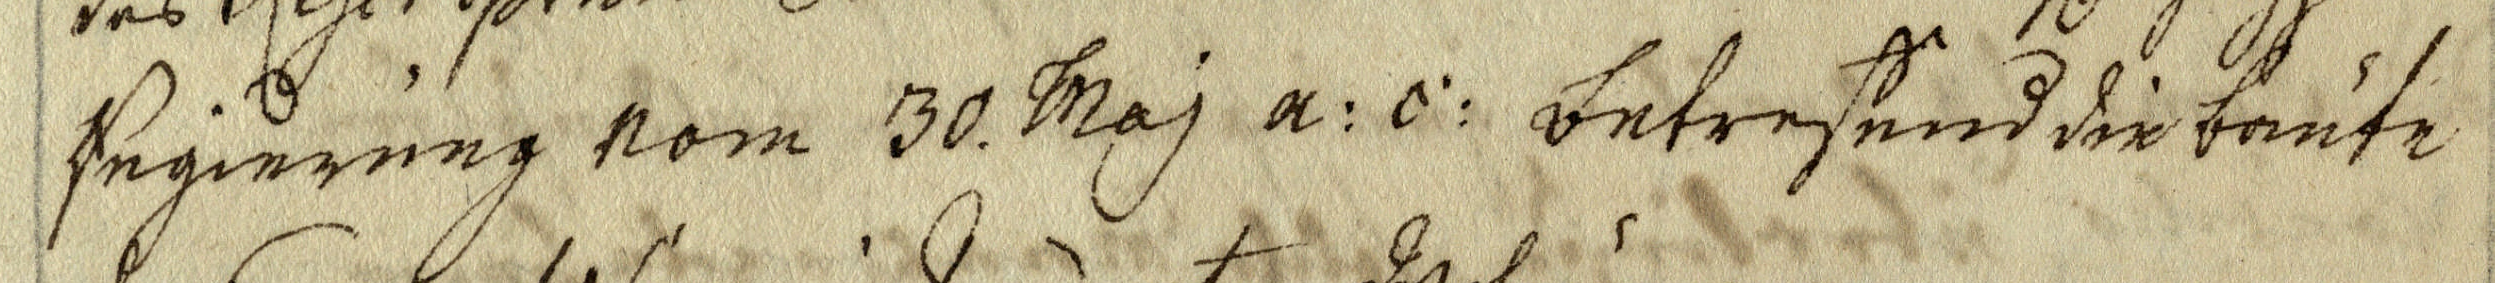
Regierung vom 30. Maj a: c: Betreffend die Baute
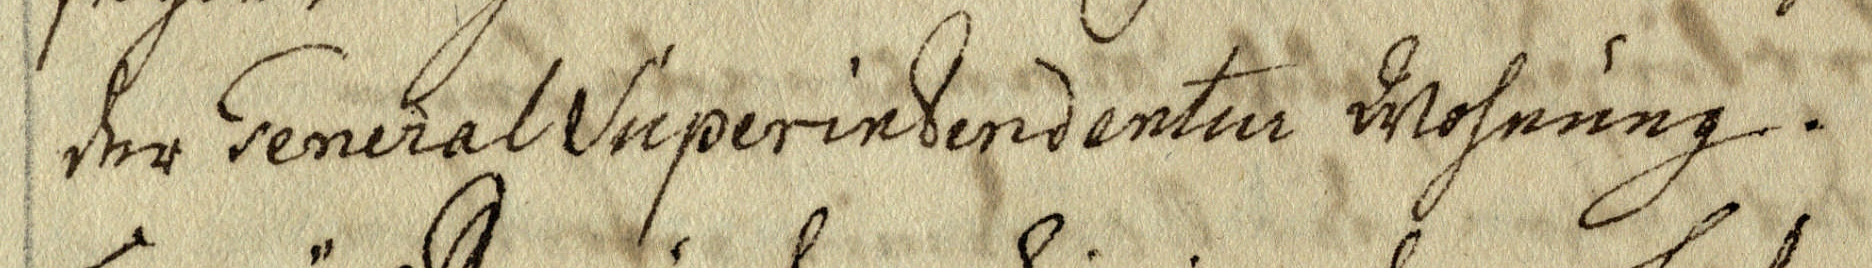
der GeneralSuperintendentur Wohnung.
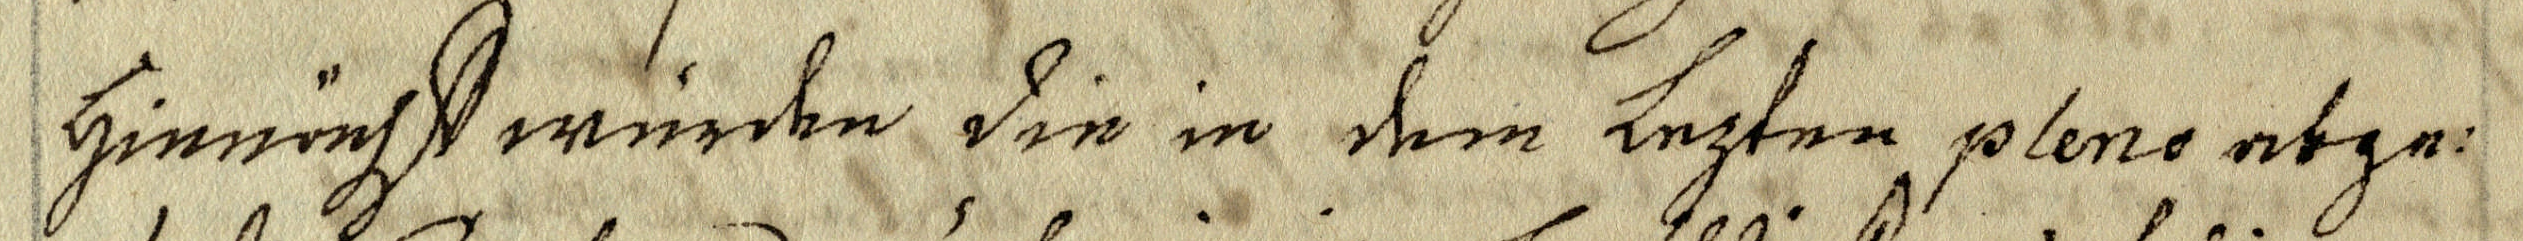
Hienächst wurden die in dem lezten pleno abge¬
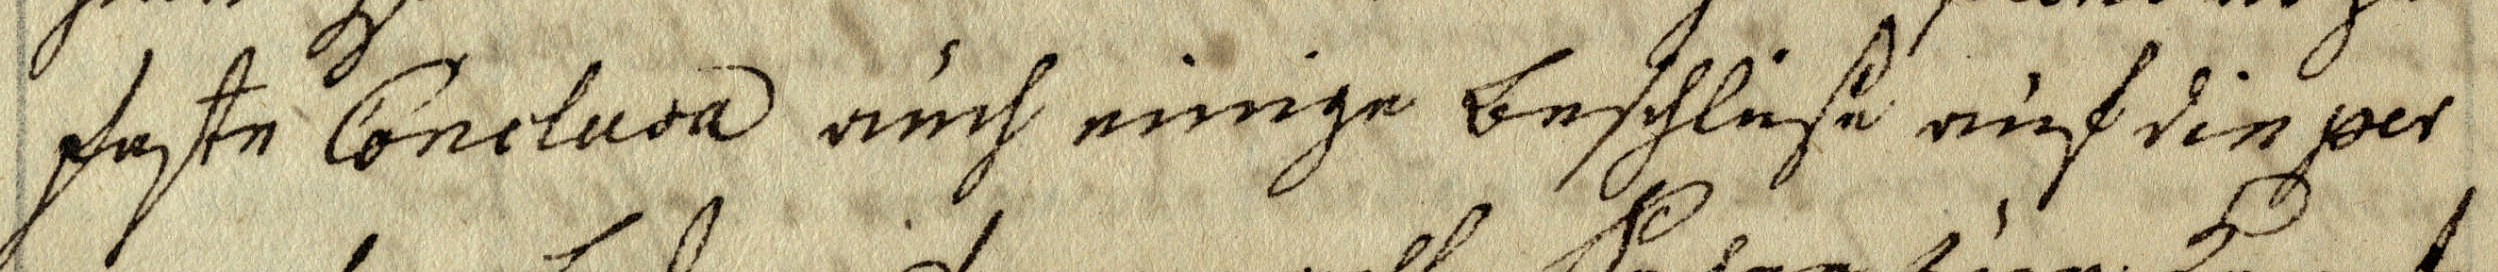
faßte Conclusa auch einige Beschlüße auf die per
